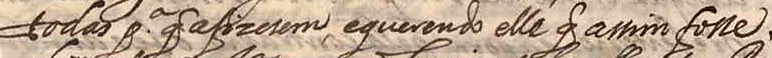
todas p.a q̄ a fizesem, e querendo elle q̄ assim fosse
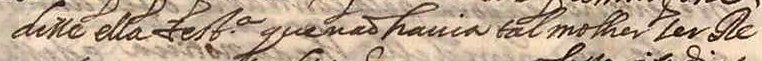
disse ella test.a que naõ hauia tal molher ser Re
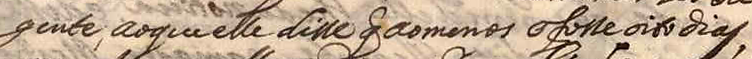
gente, ao que elle disse q̄ ao menos o fosse oito dias,
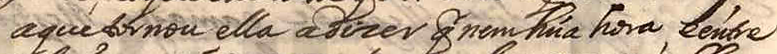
a que tornou ella a dizer q̄ nem hūa hora, e entre
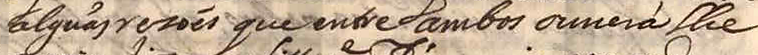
alguās rezoẽs que entre ambos ouuera lhe
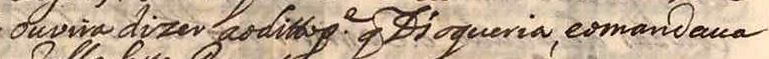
ouvira dizer ao ditto p.e q̄ Ds̄ o queria, e o mandaua
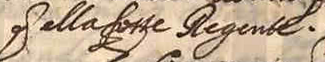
q̄ ella fosse Regente.
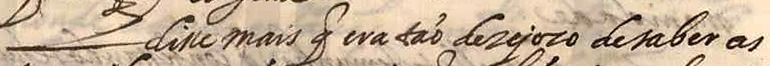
E disse mais q̄ era tão dezejozo de saber as
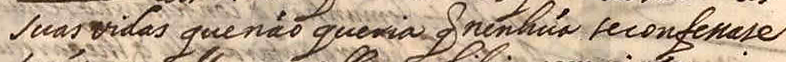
suas vidas que naõ queria q̄ nenhuā se confessase
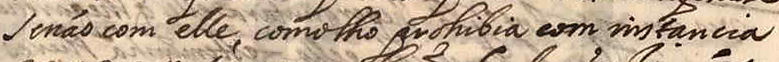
senaõ com elle, como lho prohibia com instancia
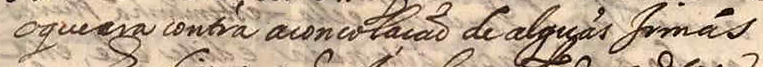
o que era contra a conçolaçaõ de alguās Jrmās
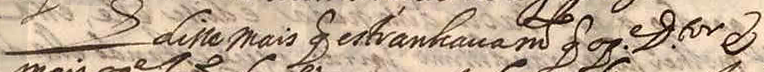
E disse mais q̄ estranhaua mto q̄ o p.e D.tor e
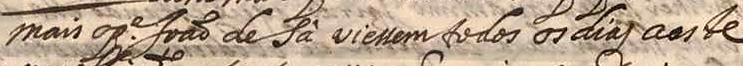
mais o p.e Joaõ de Sá viessem todos os dias a este
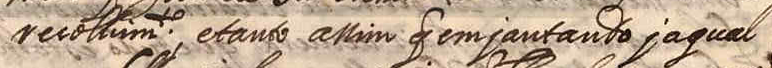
recolhim.to, e tanto assim q̄ em jantando ja qual
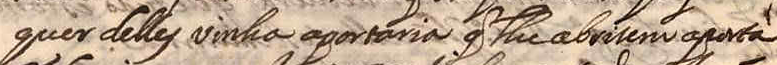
quer delles vinha a portaria q̄ lhe abrisem a porta
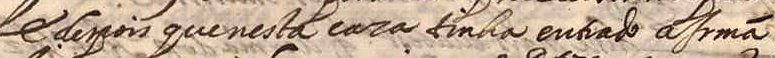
E despois que nesta caza tinha entrado a Jrmā
